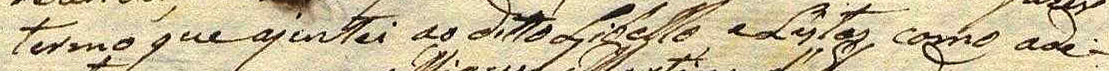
termo que ajintei ao ditto Libello, e Listas, como ade
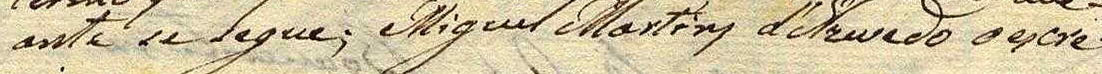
ante se segue; Miguel Martins d'Azevedo o escre
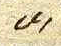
vi
